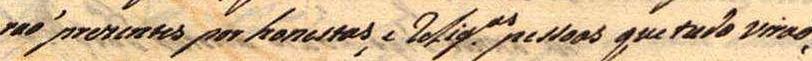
raõ prezentes por honestas, e Relig.as pessoas que tudo viraõ,
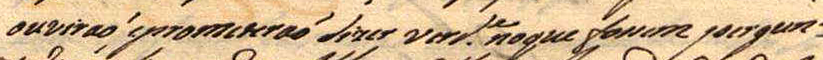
ouviraõ, e prometeraõ dizer verd.e no que fossem pergun
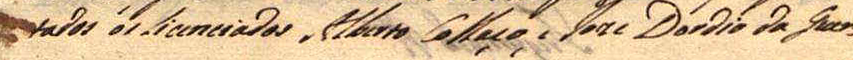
tados os licenciados, Alberto Collaço e Ioze Dordio da Guer
